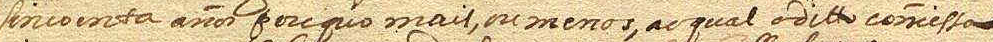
sincoenta an̄os pouquo mais, ou menos, ao qual o ditto com̄issa
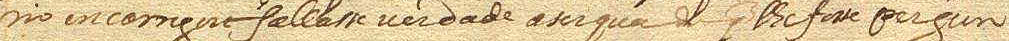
rio encarregou fallasse uerdade aserqua do q̄ lhe fosse pergun
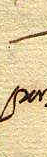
jur.
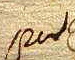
jur
